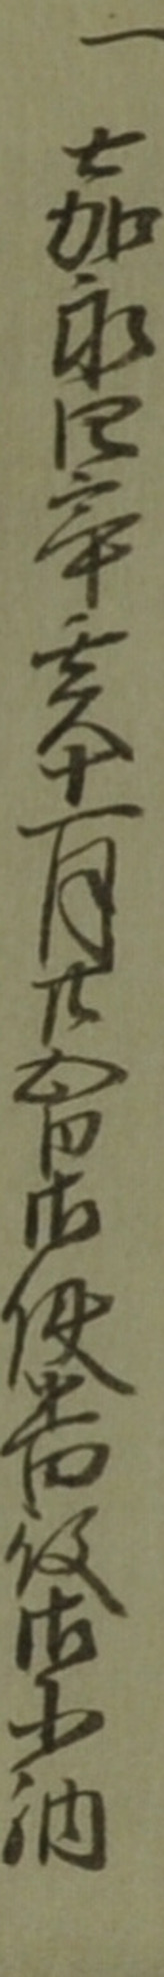一嘉永四辛亥十一月廿五日御使番役御小納
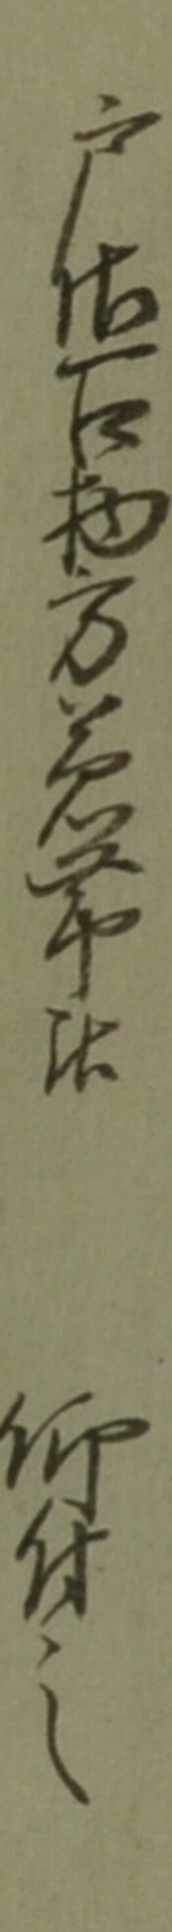戸御召物方兼帯被仰付之
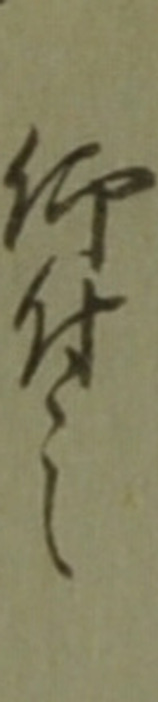仰付之
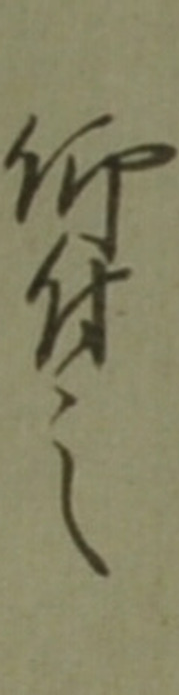仰付之
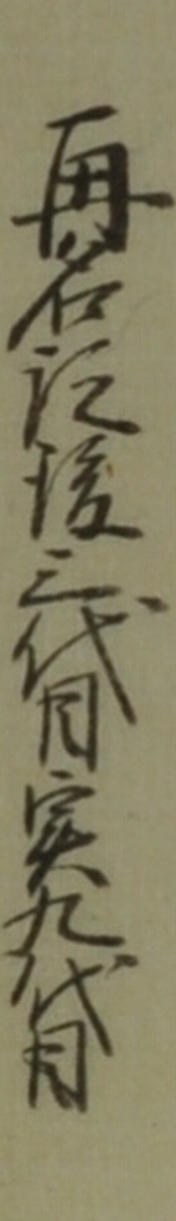再名跡後三代目実九代目
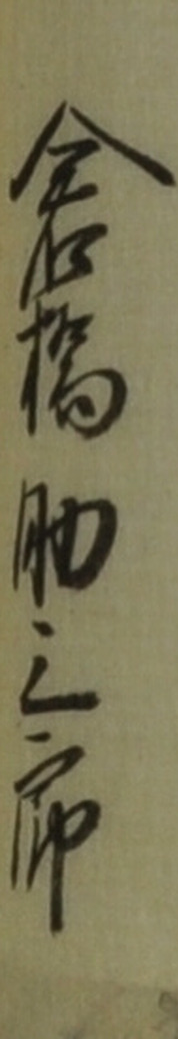倉橋助三郎
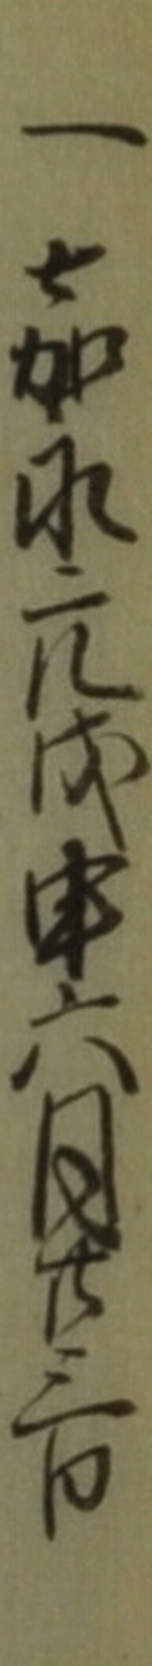一嘉永元戊申六月廿三日
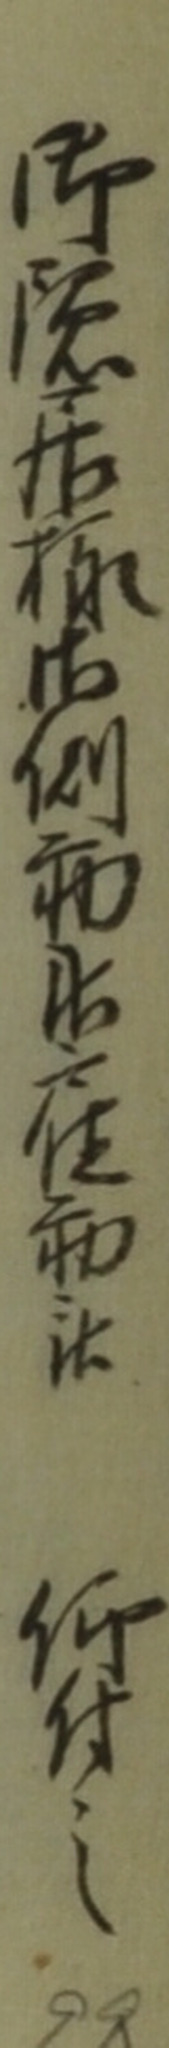御隠居様御側勤御雇勤被仰付之
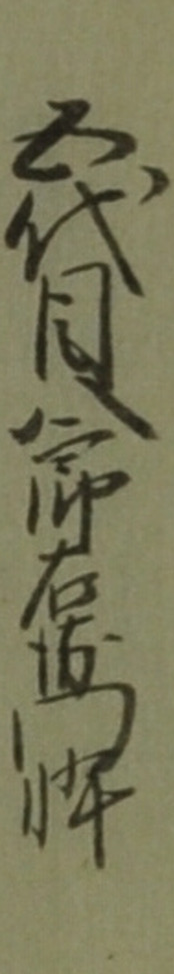五代目八郎右衛門忰
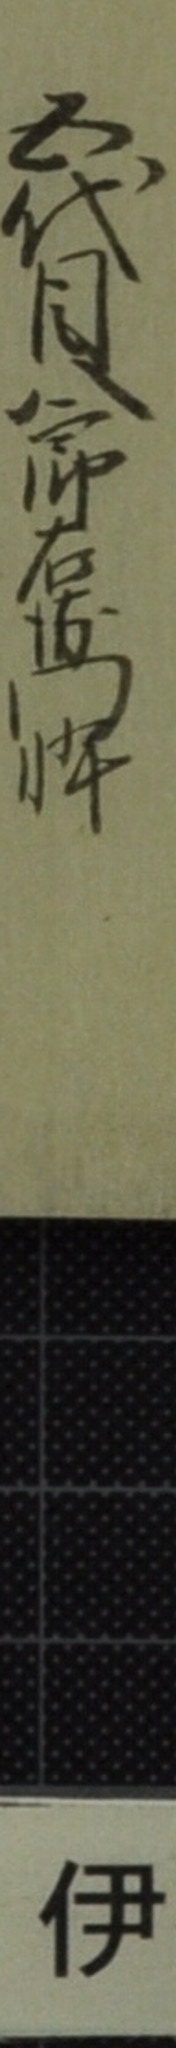五代目八郎右衛門忰
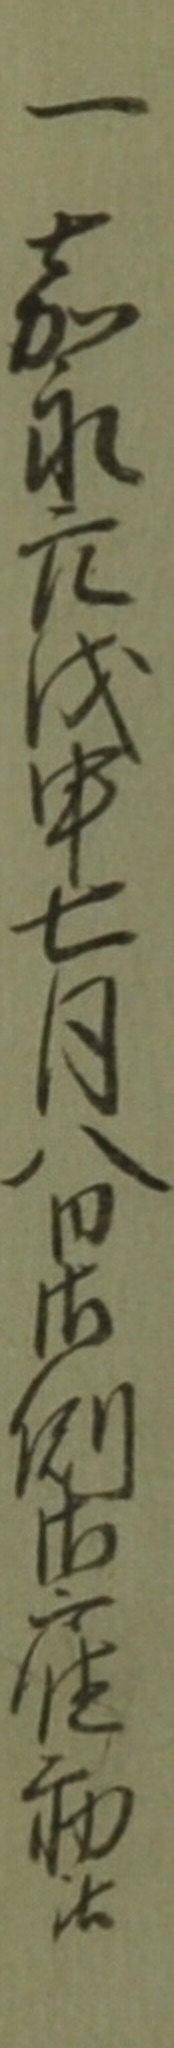一嘉永元戊申七月八日御側御雇勤被
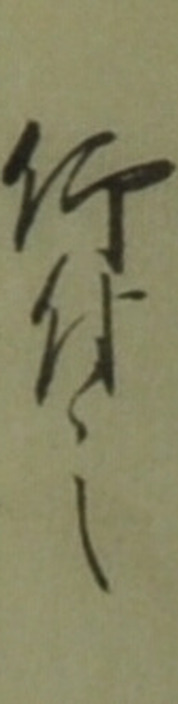仰付之
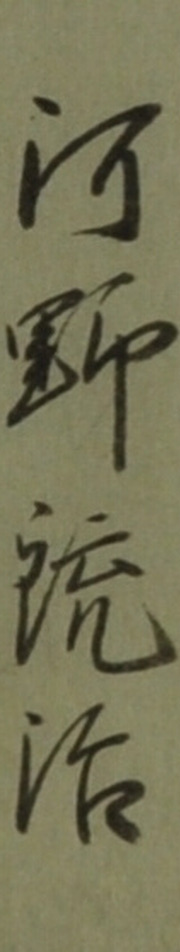河野銃治
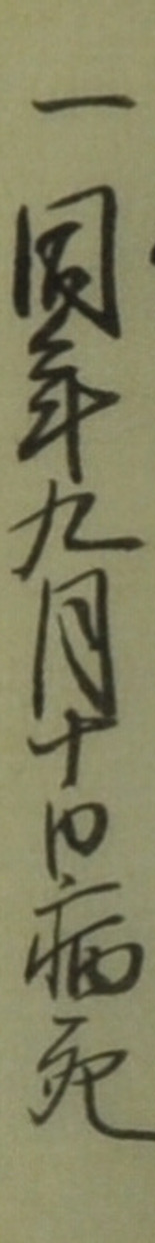一同年九月十日病死

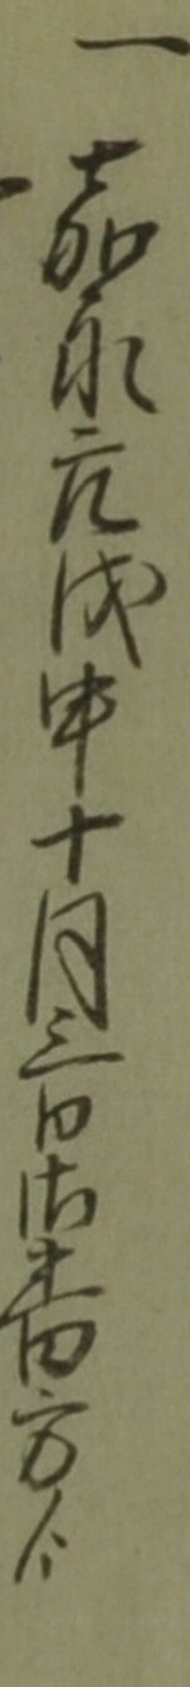一嘉永元戊申十月三日御番方ゟ
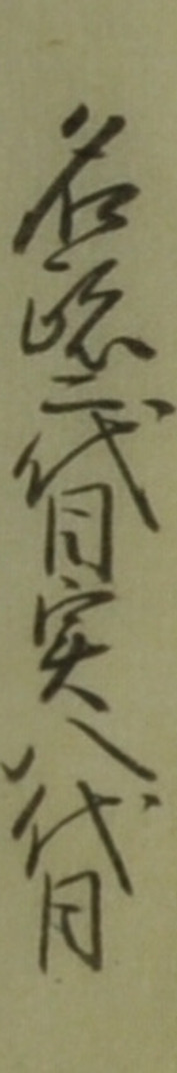名跡二代目実八代目
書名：諸御役代々録（五）
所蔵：伊那市立高遠町図書館・合同会社AMANE
